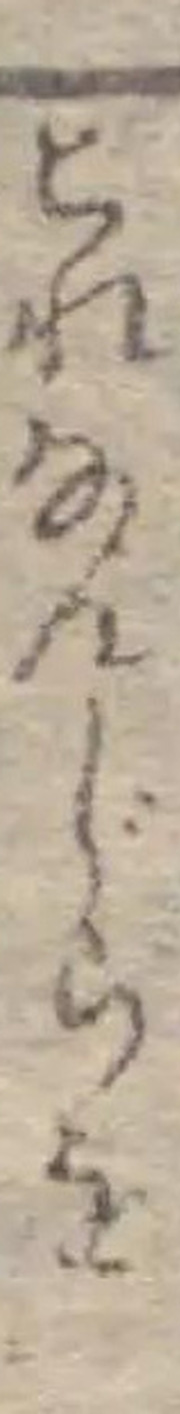これなんじらを
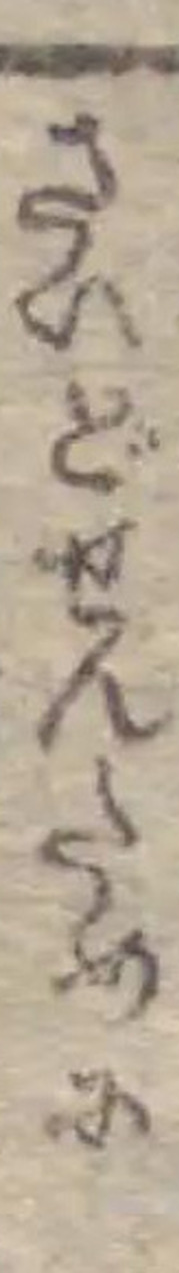さいどせんために
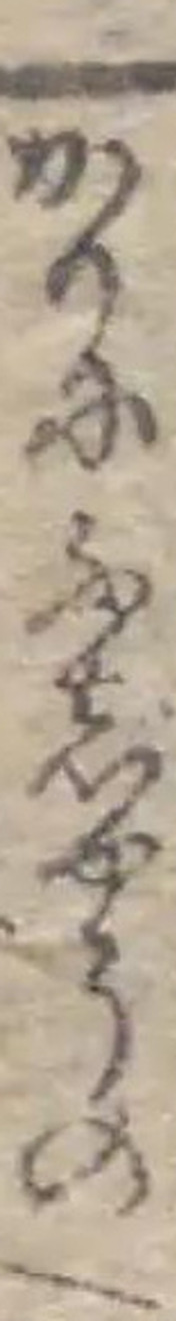ありにふじやうの
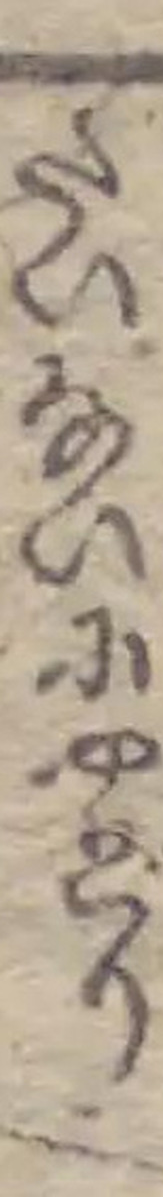たいないにやどり
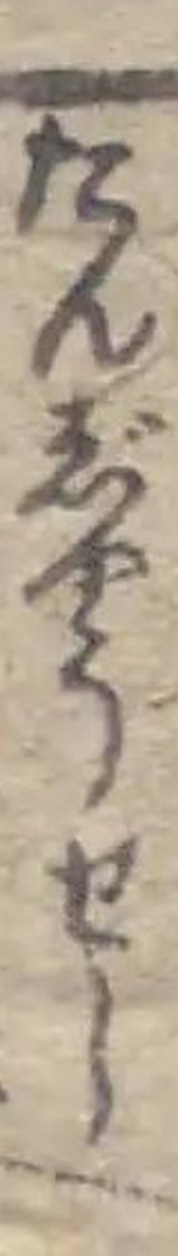たんじやうせし
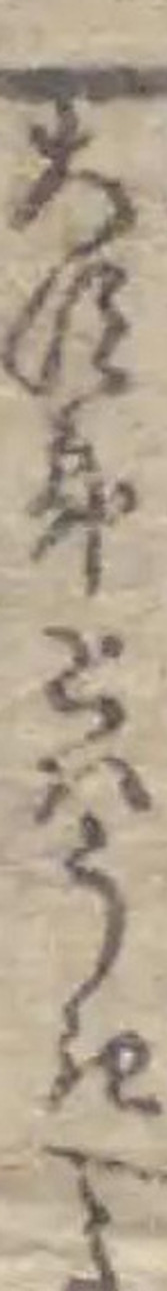大次郎とはうきよ
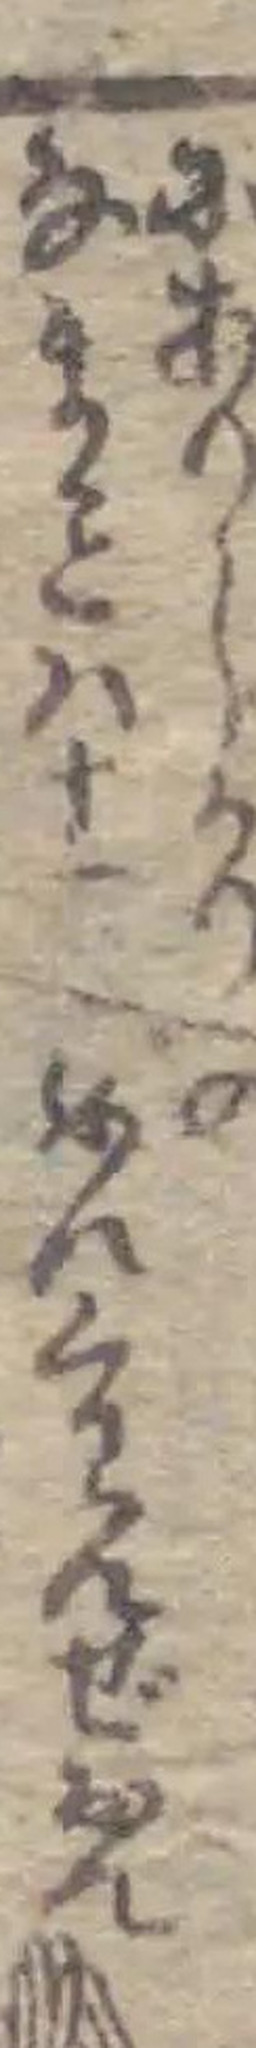なまことは十一めんくわんぜおん
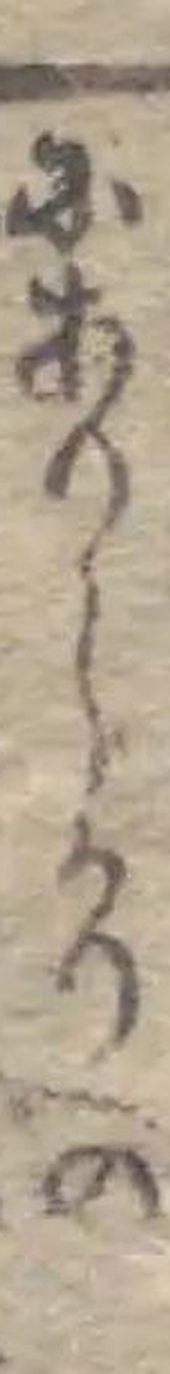にありしかり
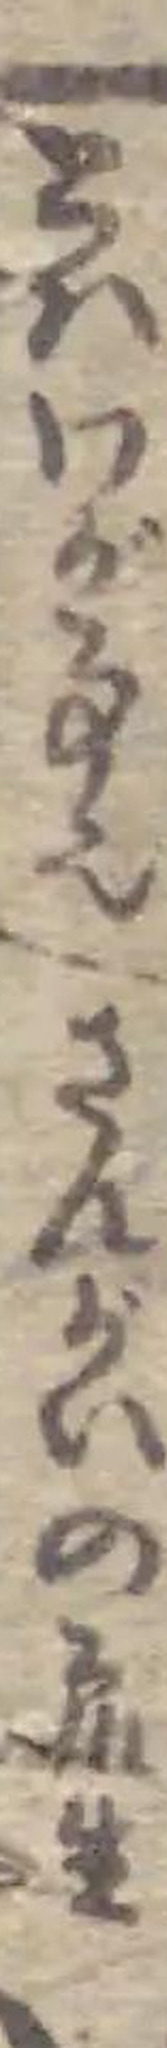とはわが事也さんがいの衆生
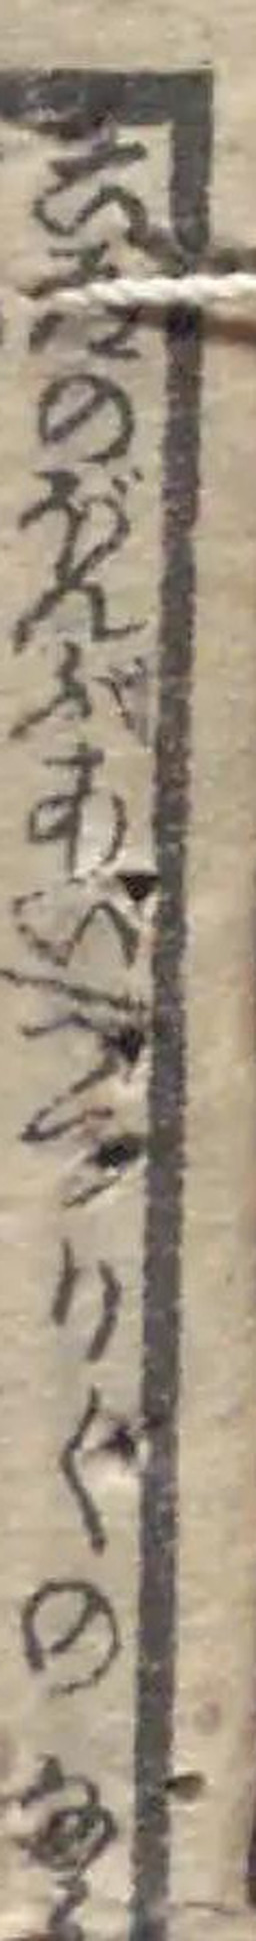六道のぼんぶあいへつりくのなみ
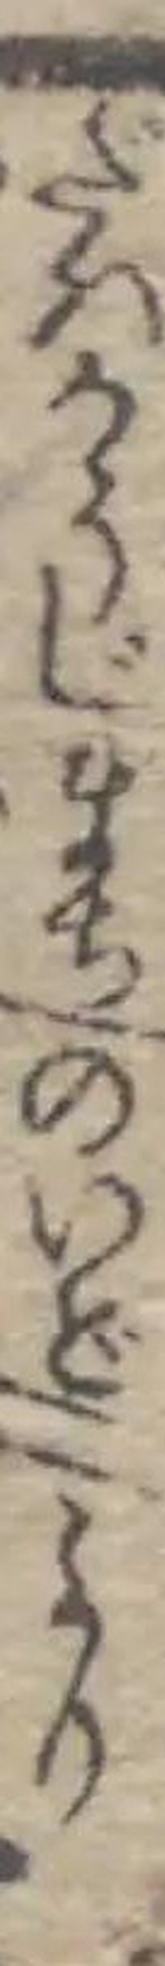だはかうじまちのいどより
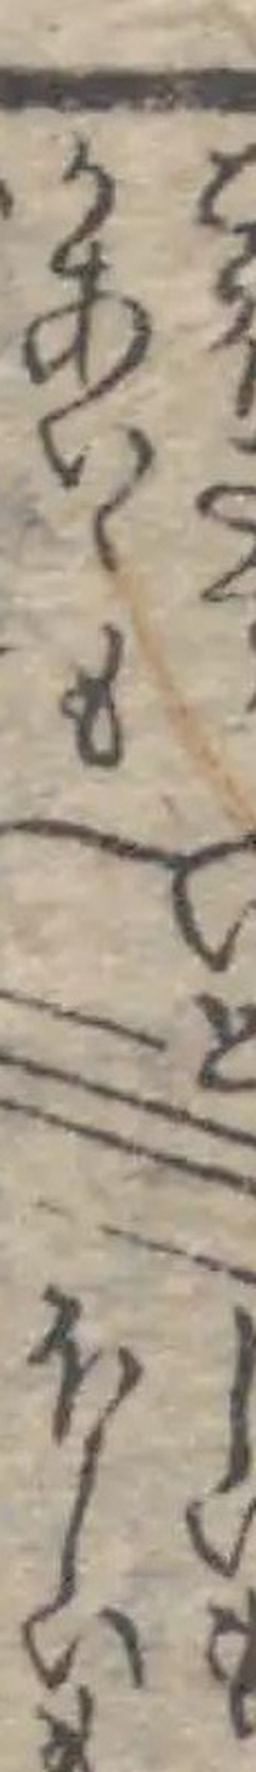かあいゝもほしいも
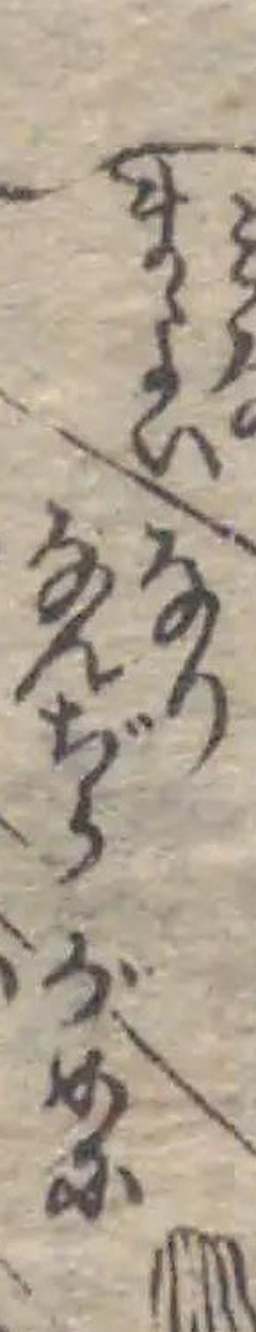なんぢらがめに
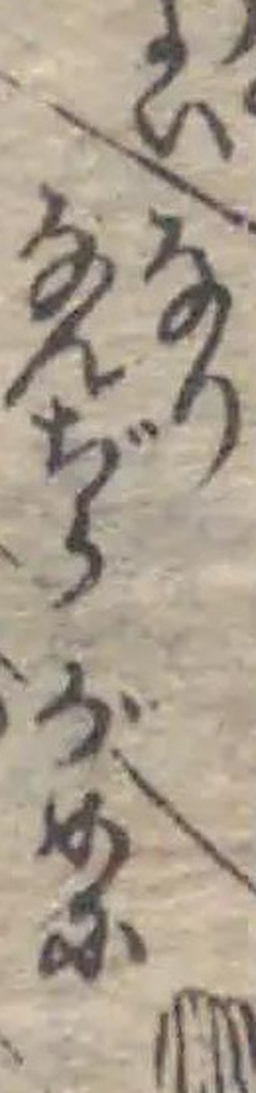なんぢらがめに
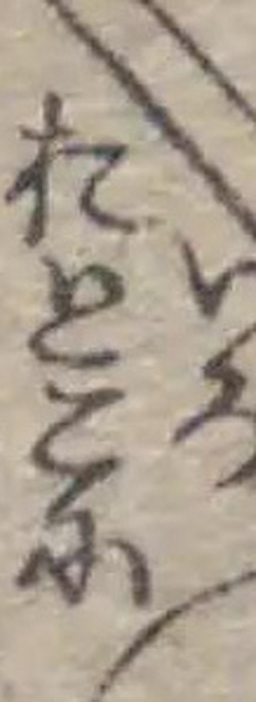をとこに
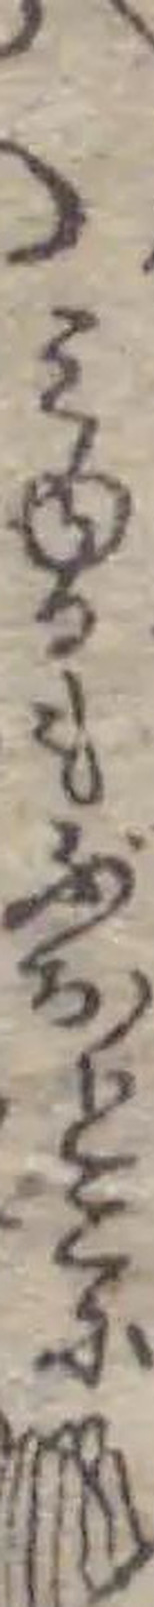みゆるもぶおとこに
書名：福壽海旡量品玉 3巻
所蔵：国立国会図書館 National Diet Library, JAPAN
